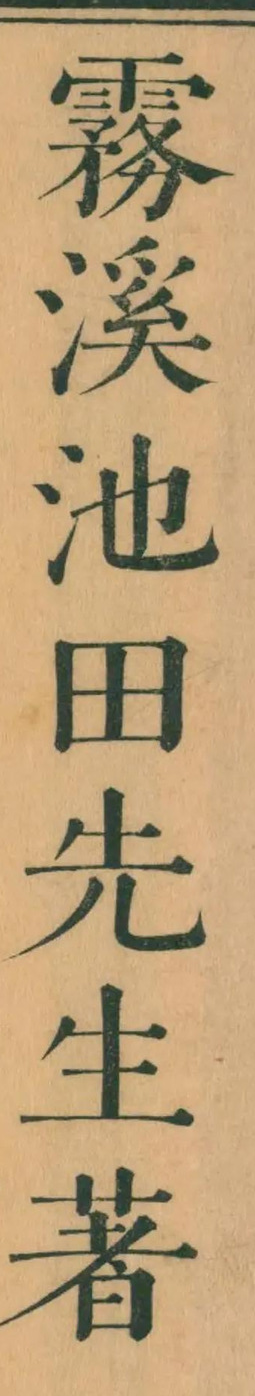霧渓池田先生著
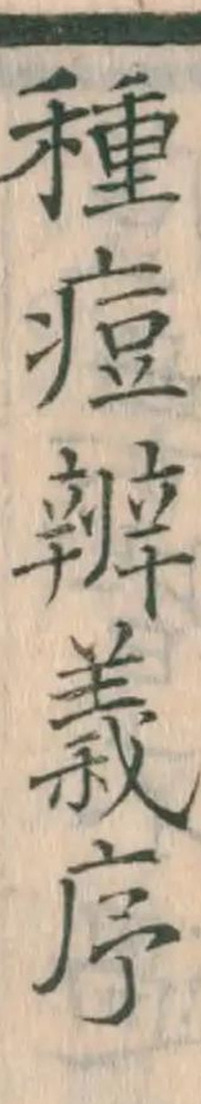種痘弁義序
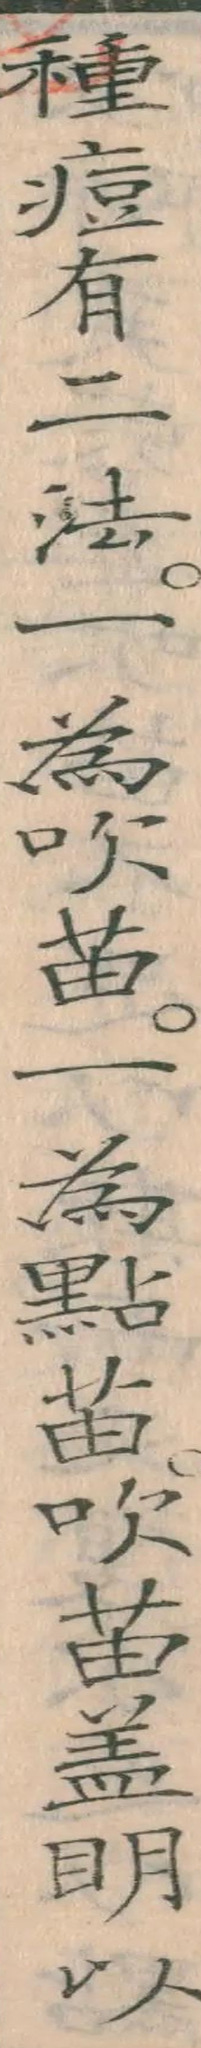種痘有二法。一為吹苗。一為点苗。吹苗盖明以
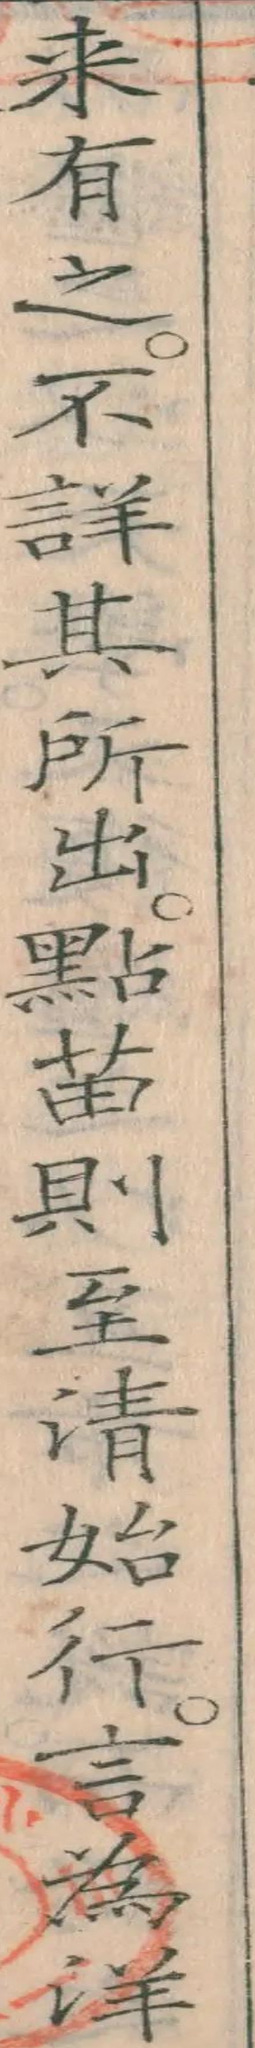来有之。不詳其所出。点描則至清始行。言為洋
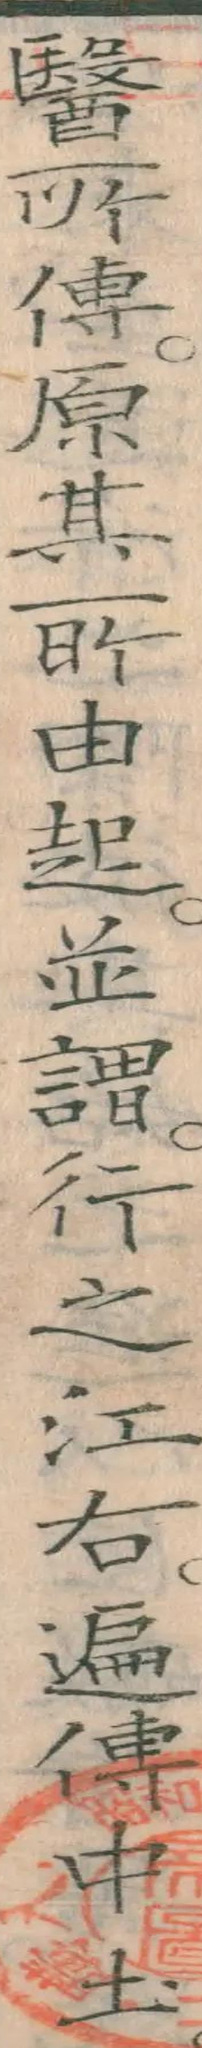医所伝。原其所由起。並謂。行之江右。遍伝中土。
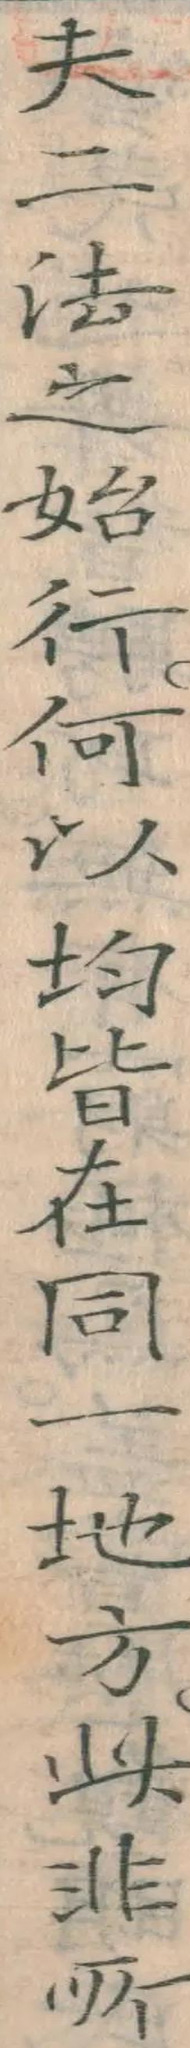夫二法之始行。何以均皆在同一地方。此非所
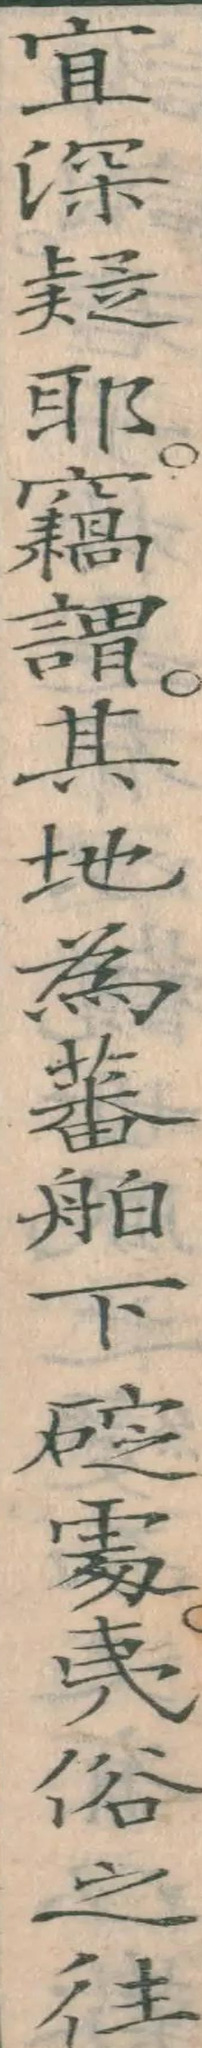宜深疑耶。竊謂。其地為蕃舶下碇処。夷俗之往
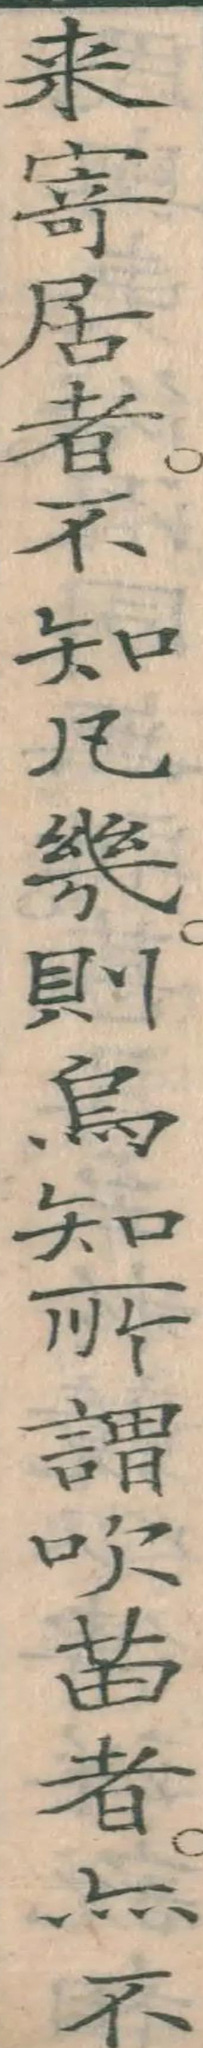来寄居者。不知凡幾。則烏知所謂吹苗者。無不
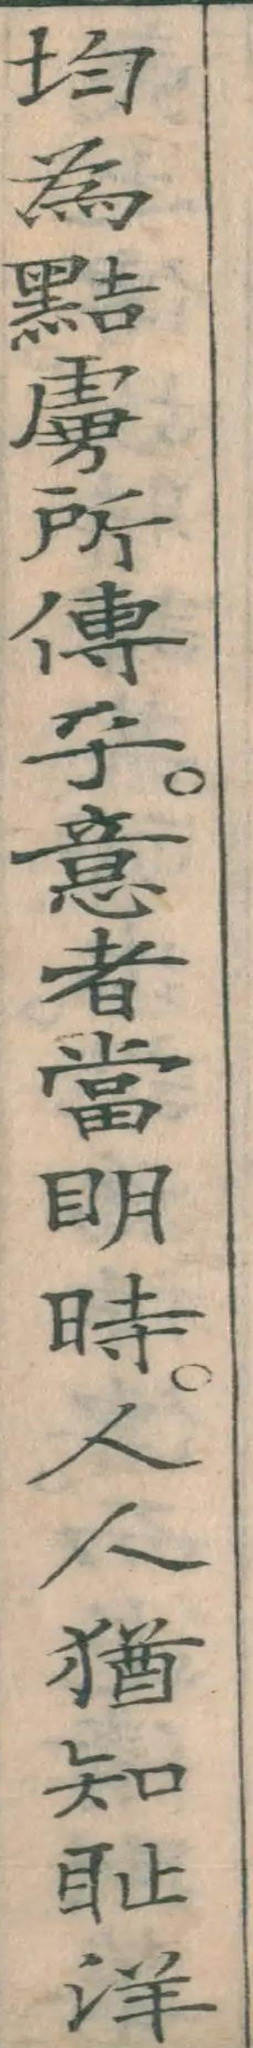均為点虜所伝乎。意者当明時。人人猶知耻洋。

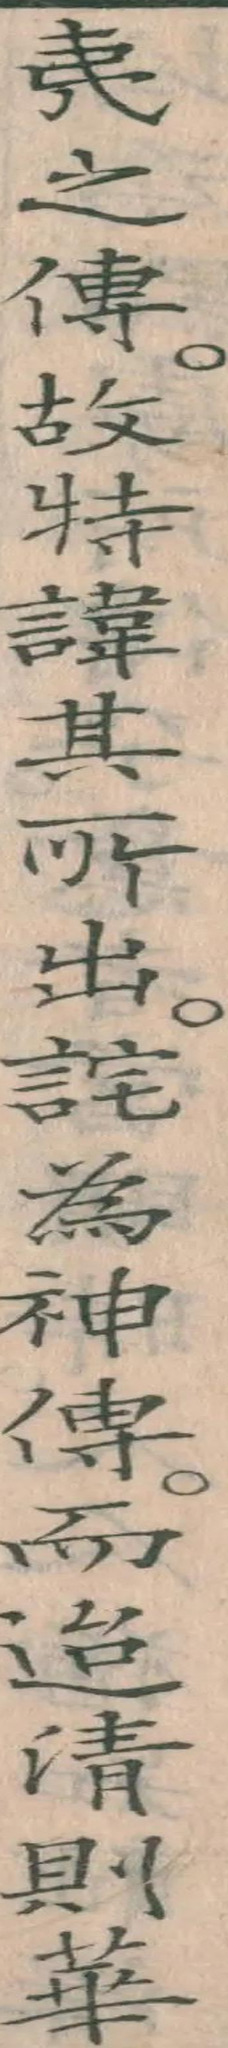夷之伝。故特諱其所出。詫為神伝。而迨清則華
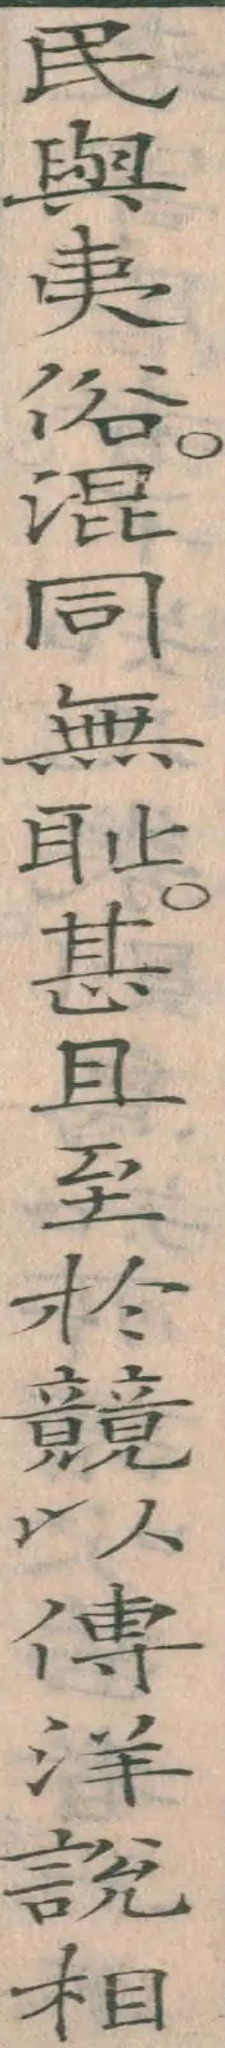民与夷俗。混同無耻。甚且至於競以伝洋説相
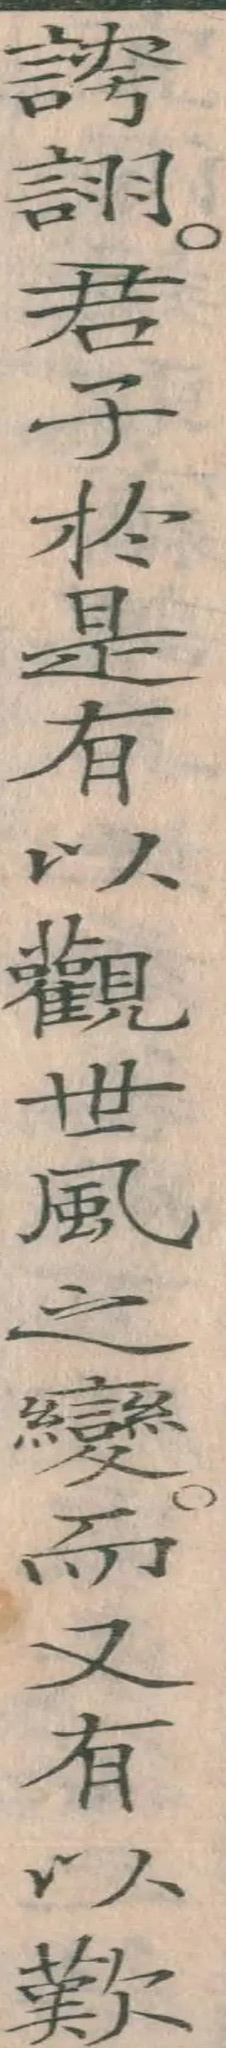誇詡。君子於是有以観世風之変。而又有以歎
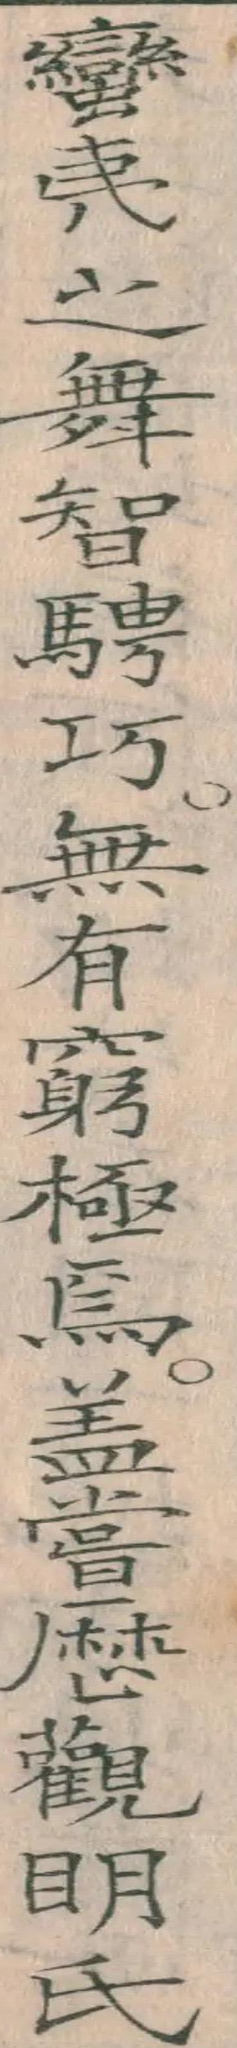蛮夷之舞智騁巧。無有窮極焉。蓋嘗歴観明氏
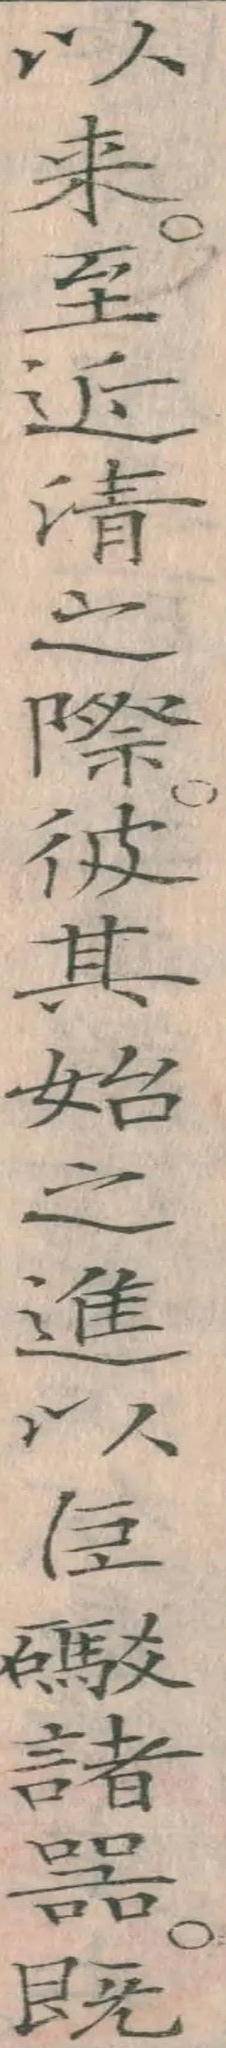以来。至近清之際。彼其始之進以臣礟諸器。既
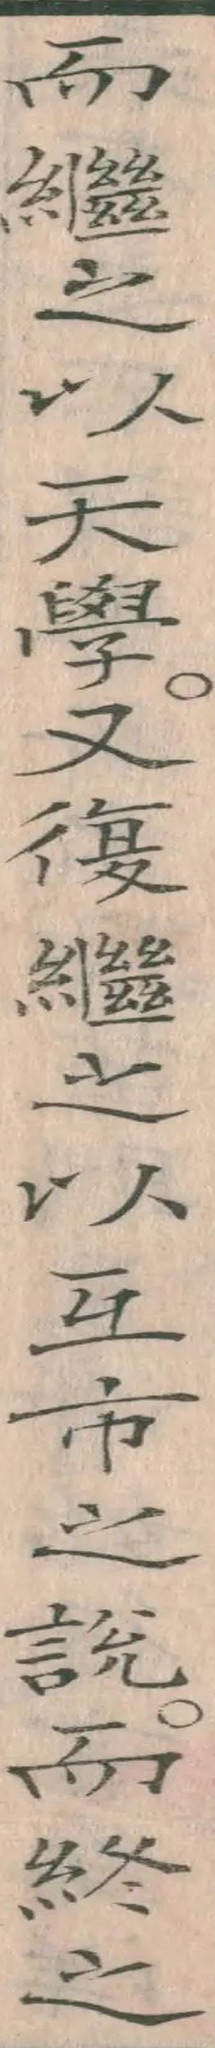而継之以天学。又復継之以互市之説。而終之
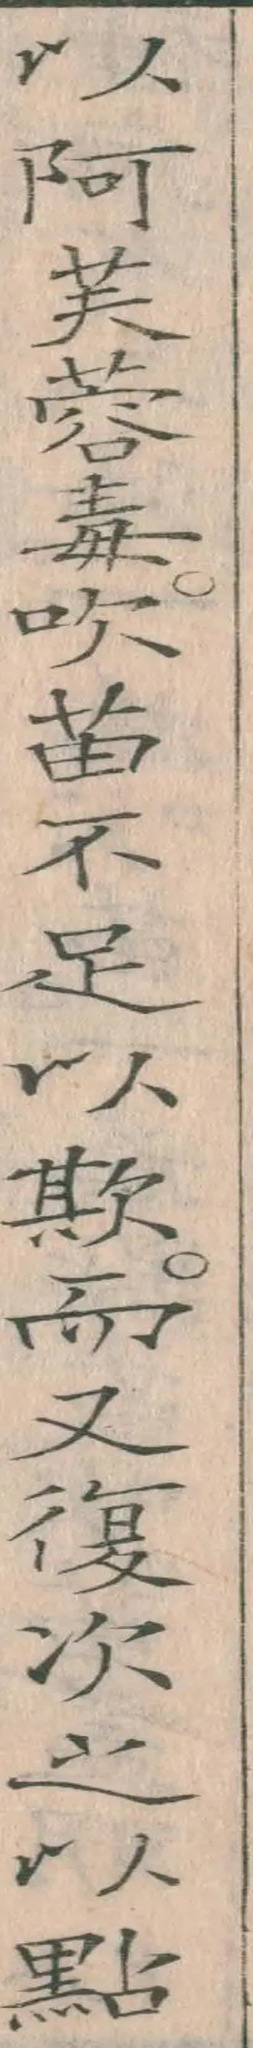以阿芙蓉毒。吹苗不足以欺。而又復次之以点
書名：種痘弁義
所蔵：国立国会図書館 National Diet Library, JAPAN
